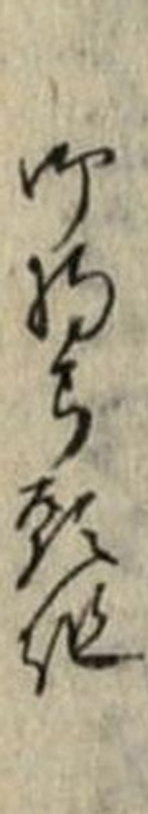御持弓頭組
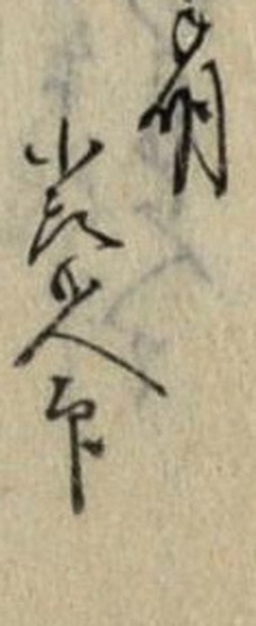小頭弐人印
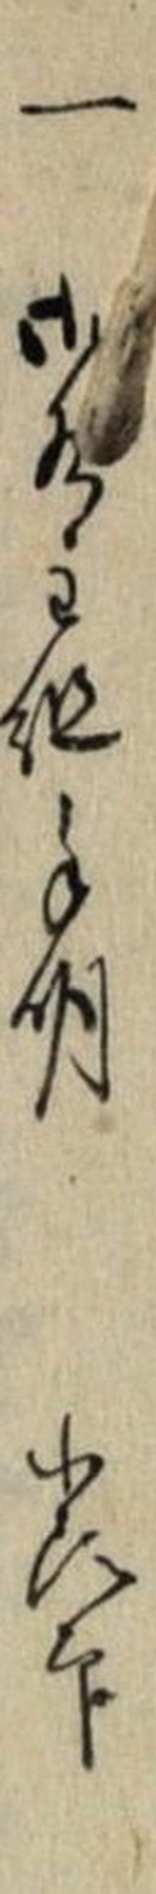一御水主組手明小頭印
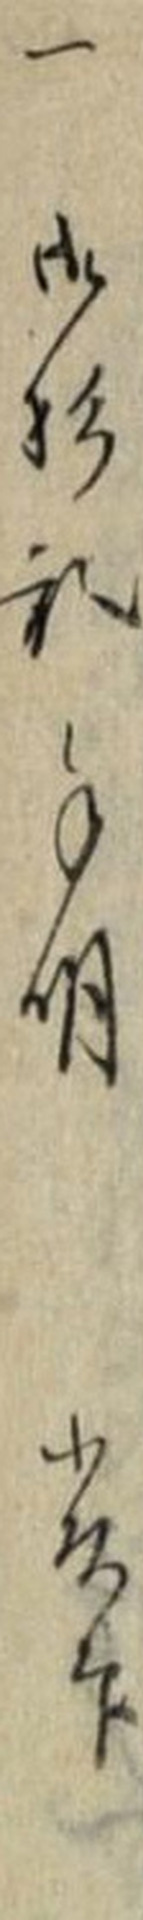一御杉形手明小頭印
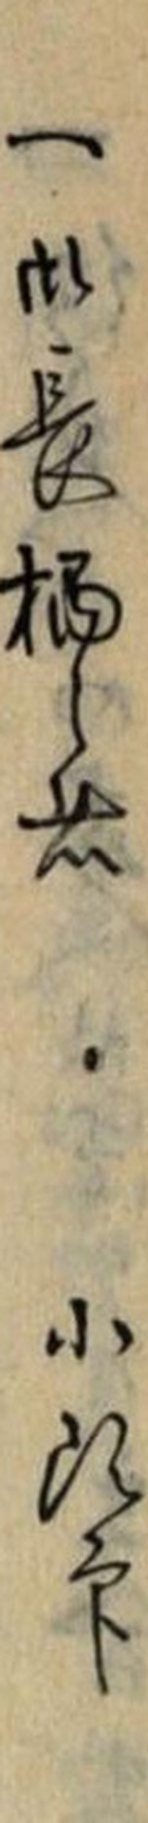一御長柄之者小頭印
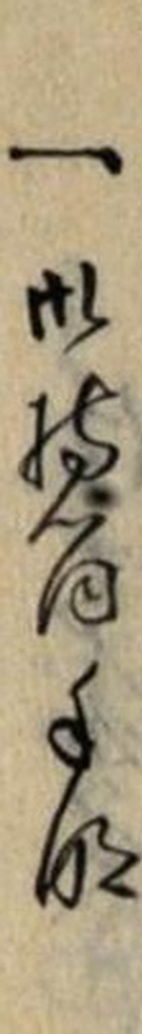一御持筒手明
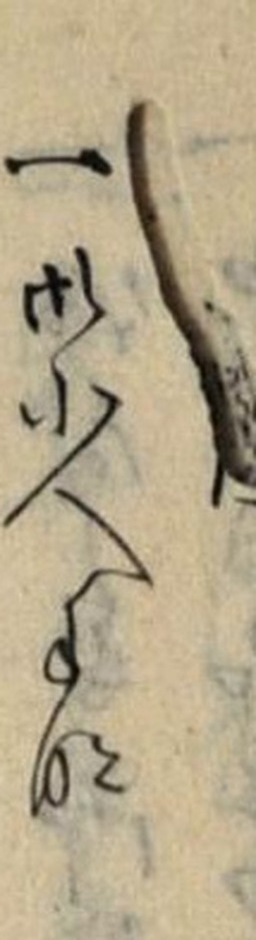一御持筒手明
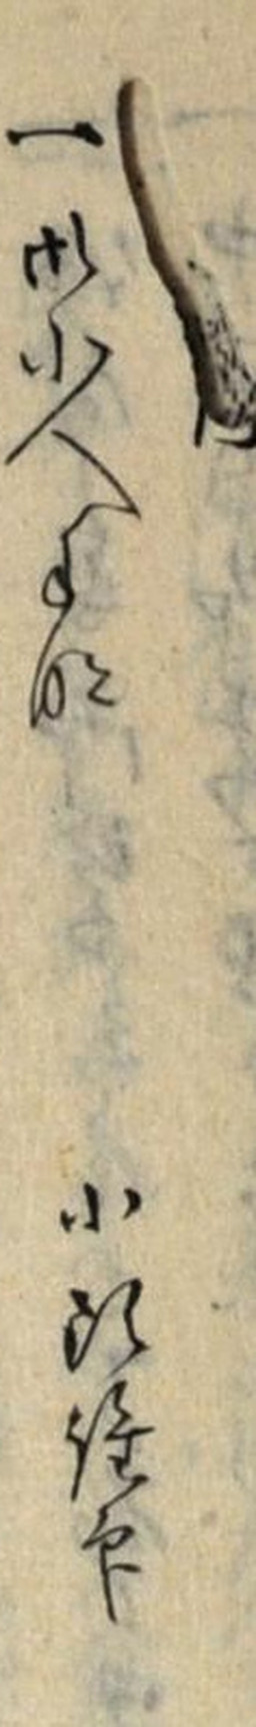一御小人手明小頭誰印
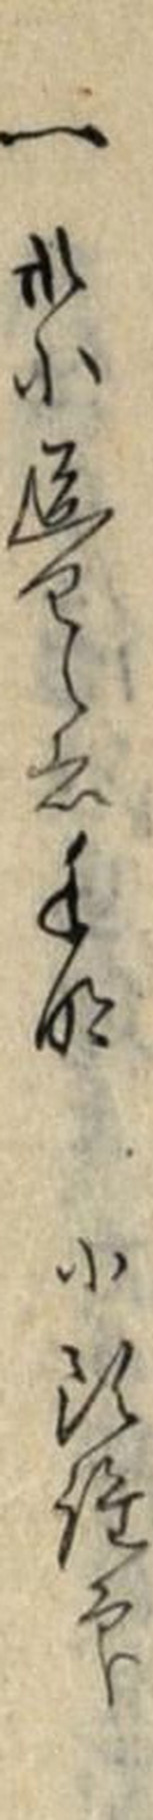一御小道具之者手明小頭誰印
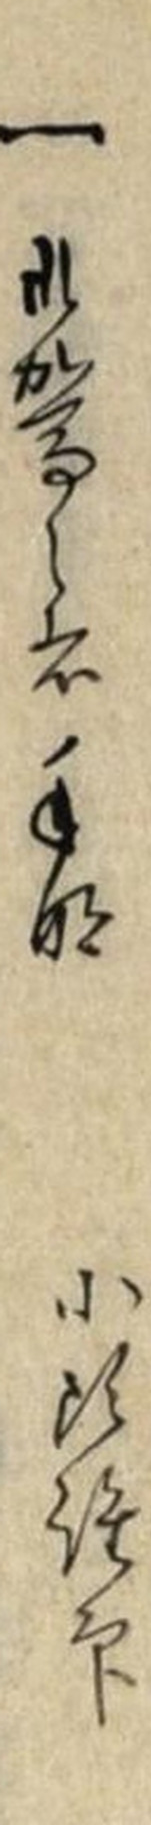一御駕之者手明小頭誰印
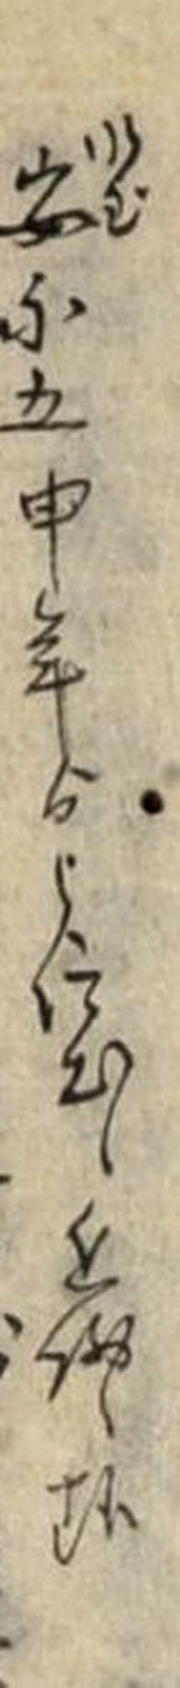安永五申年ゟ被仰出候近例之趣
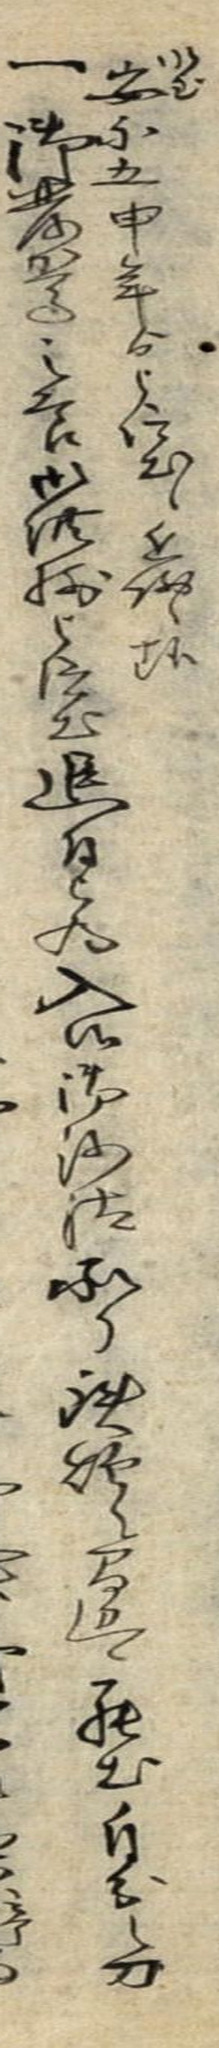一御発駕之節御供揃被仰出追付被為入候御沙汰承り鉄炮之間辺へ罷出自分之刀
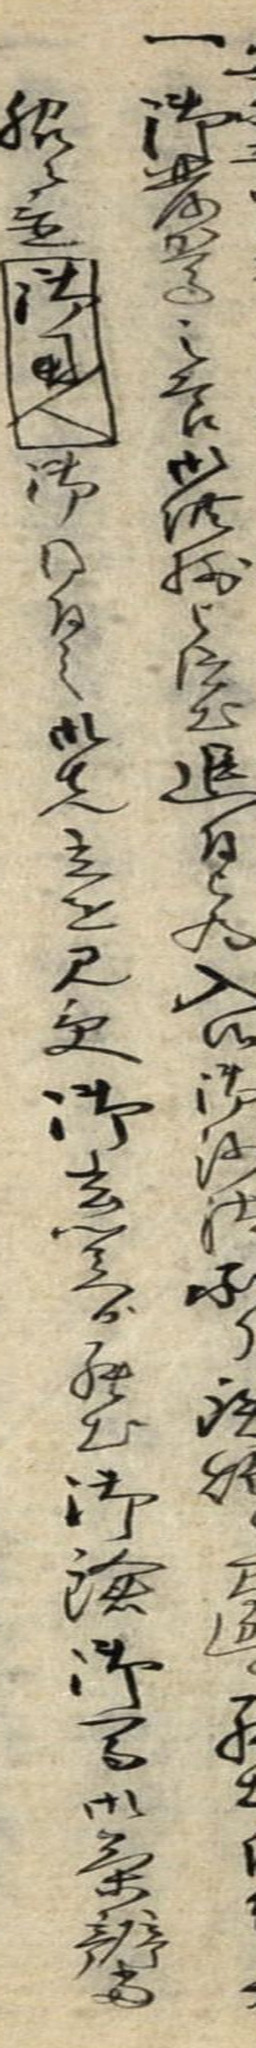脇に置御用人御目付之御先立を見受御玄関ゟ罷出御鎗御馬御茶弁当
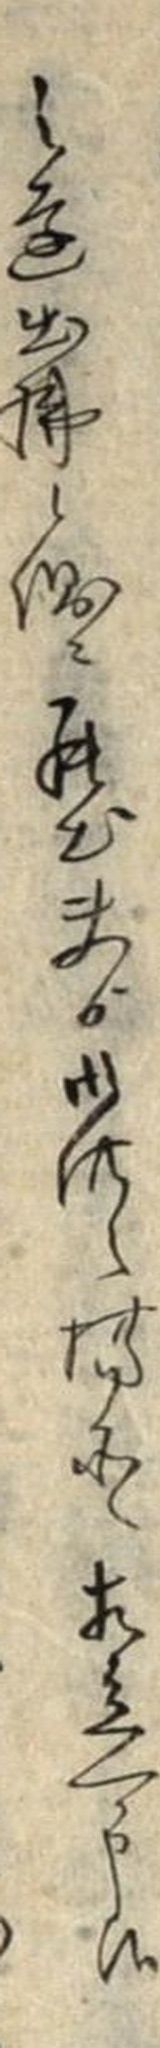之遂出払候側に罷出夫ゟ御供之場所へ相立可申候
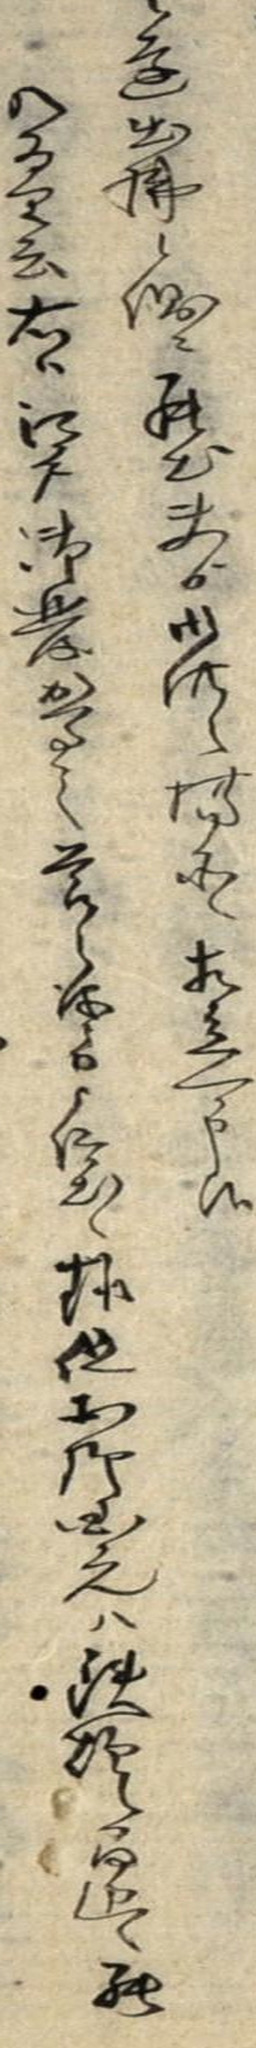八百里云右は江戸御発駕之節之儀に付被仰出候趣但於御国元は鉄炮之間辺へ罷
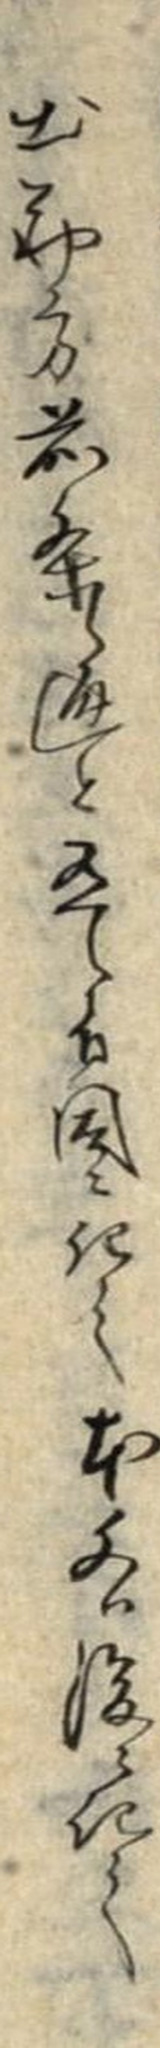出勤方前条之通と有之に付因に記之本文は後に記之
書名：三都并道中之部
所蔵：福井県文書館 Fukui Prefectural Archives
